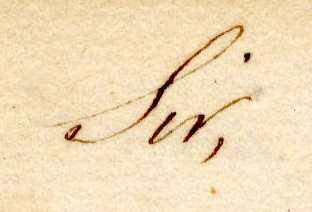Sir,
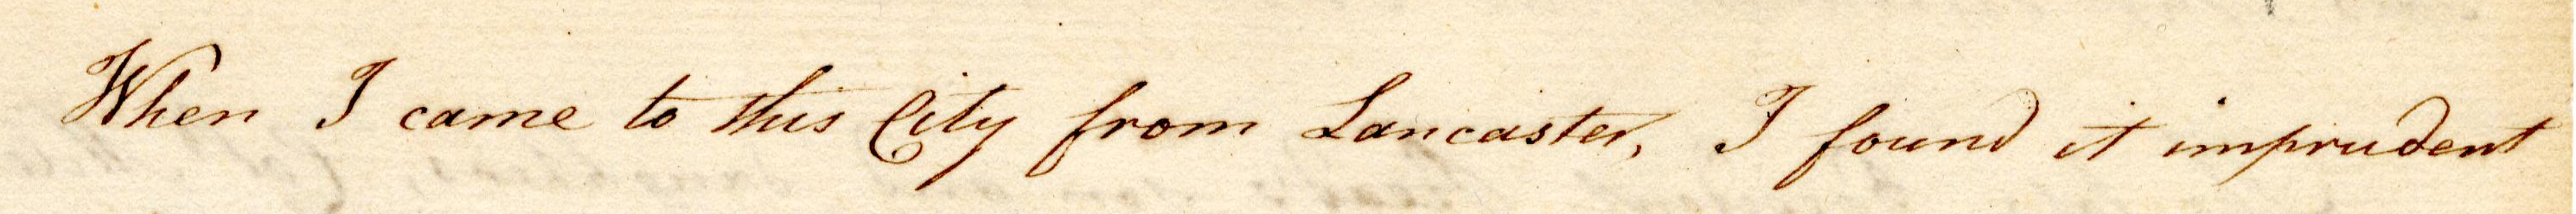When I came to this City from Lancaster, I found it imprudent
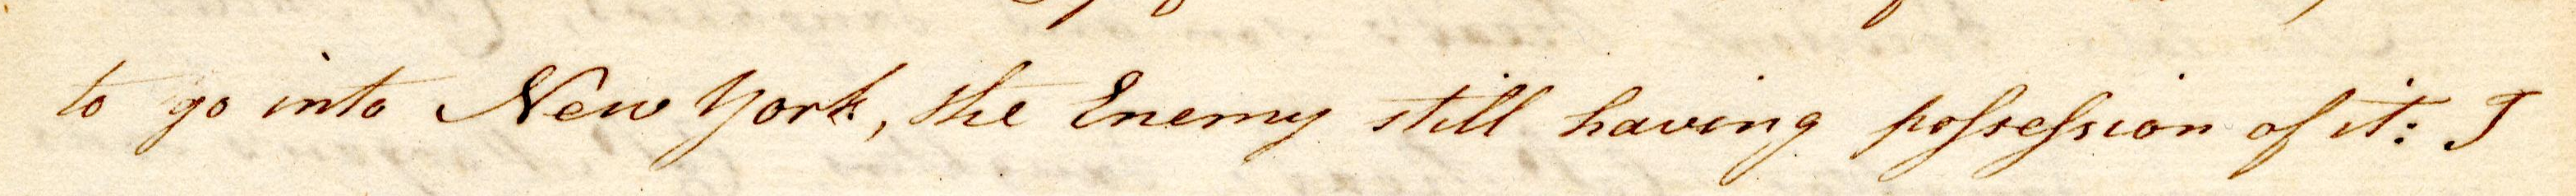to go into New York, the Enemy still having possession of it. I
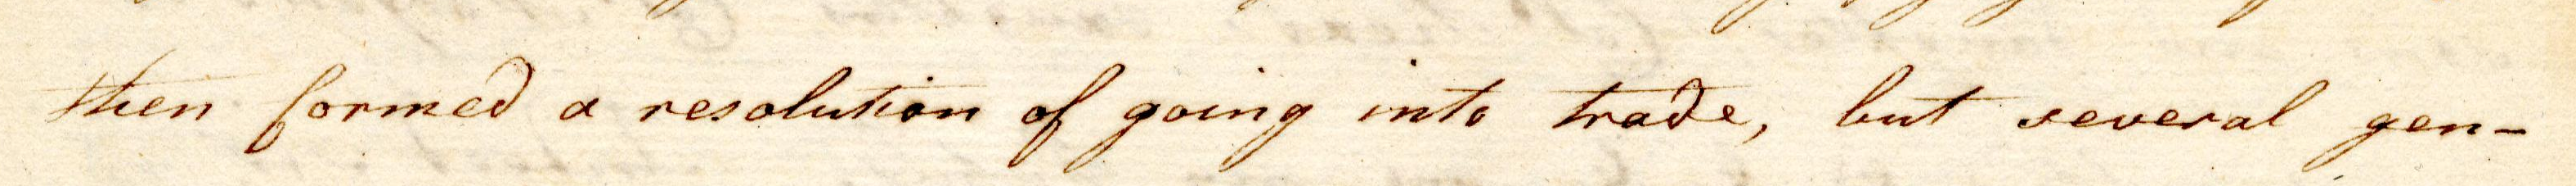then formed a resolution of going into trade, but several gen-
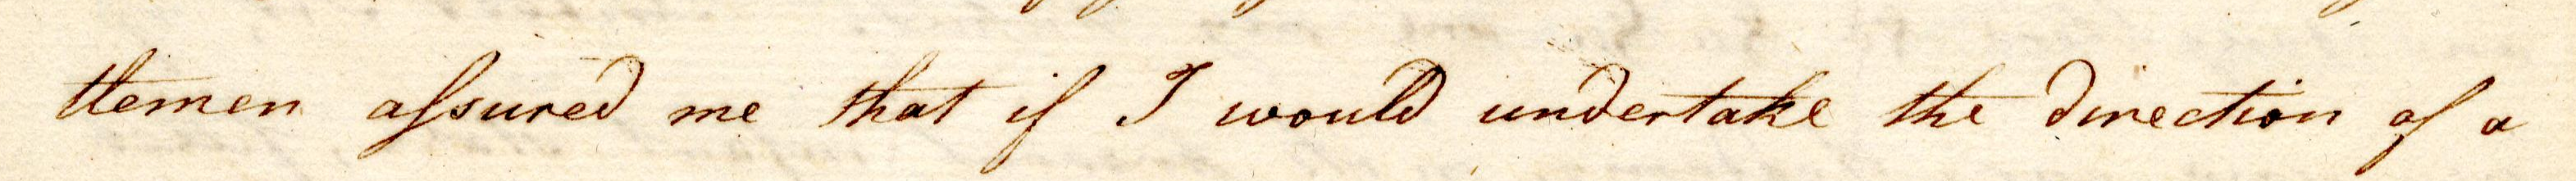tlemen assured me that if I would undertake the direction of a
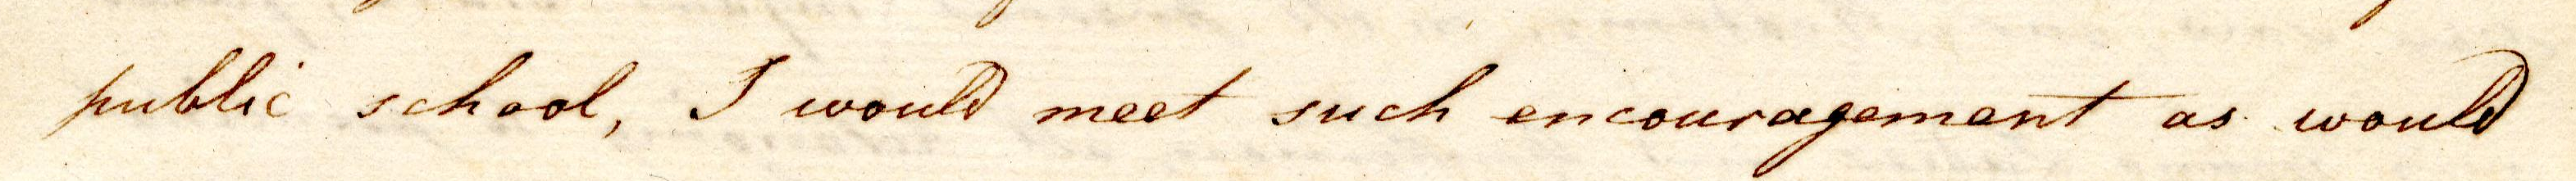public school, I would meet such encouragement as would
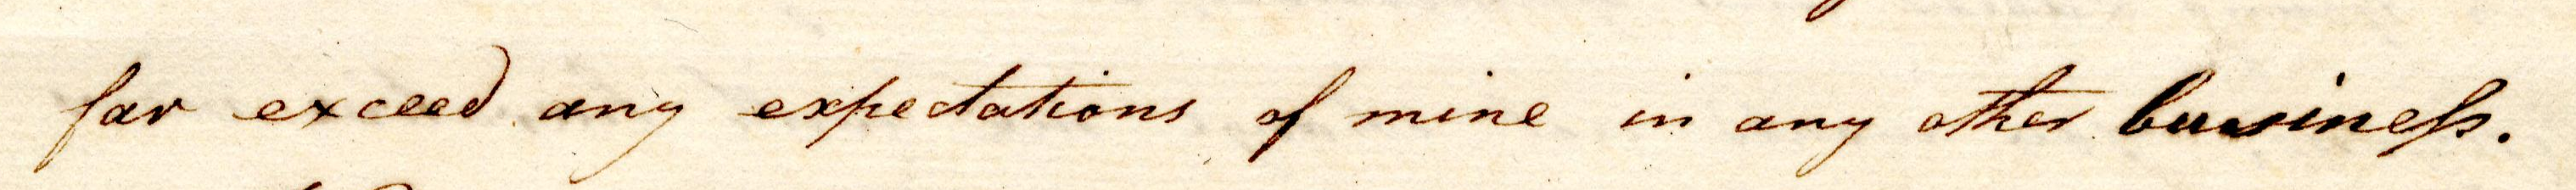far exceed any expectations of mine in any other business.
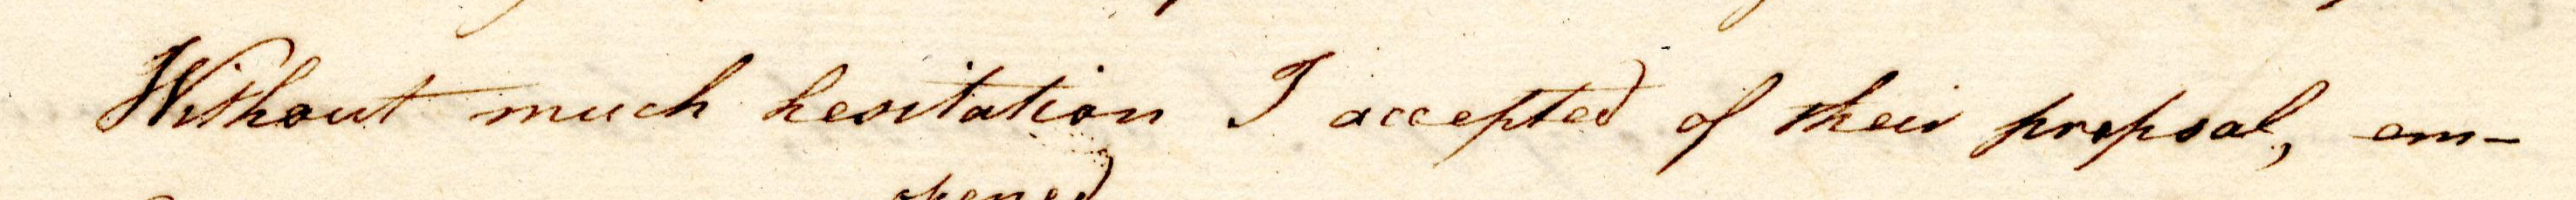Without much hesitation I accepted of their propsal, em-
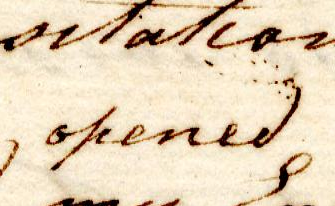opened
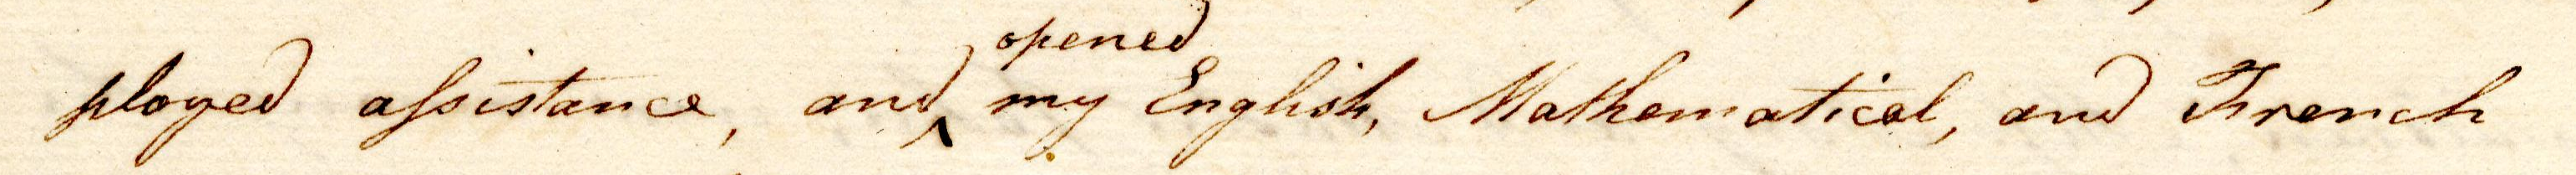-ployed assistance, and ^ my English, Mathematical, and French
